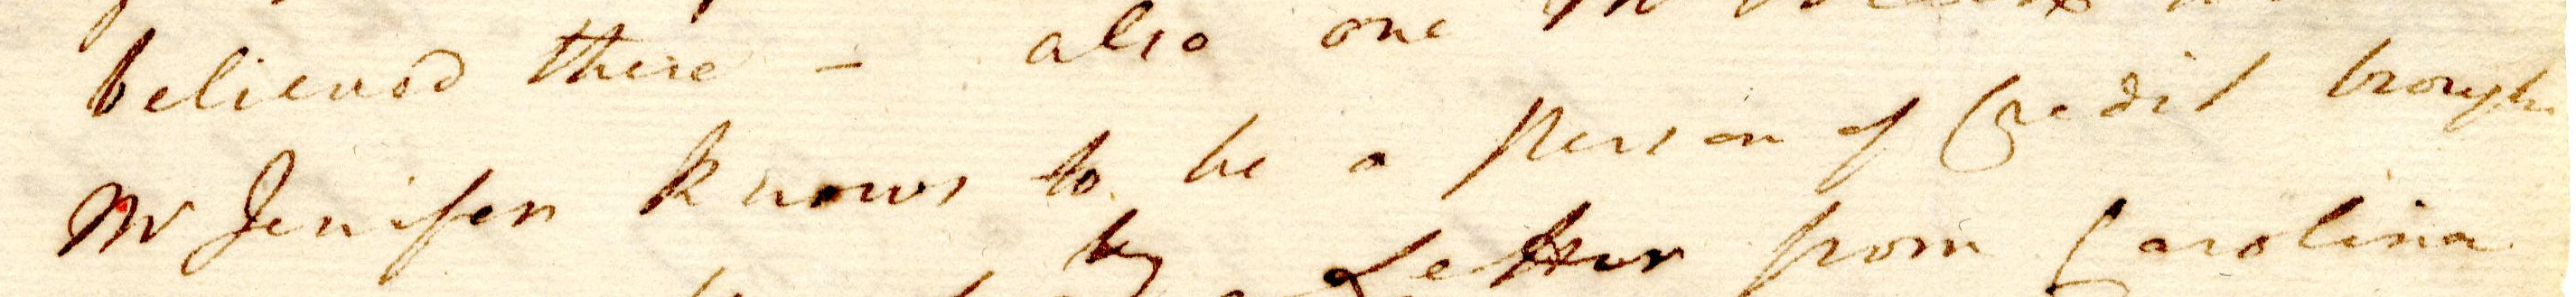M^r Jenifer knows to be a person of Credit brought
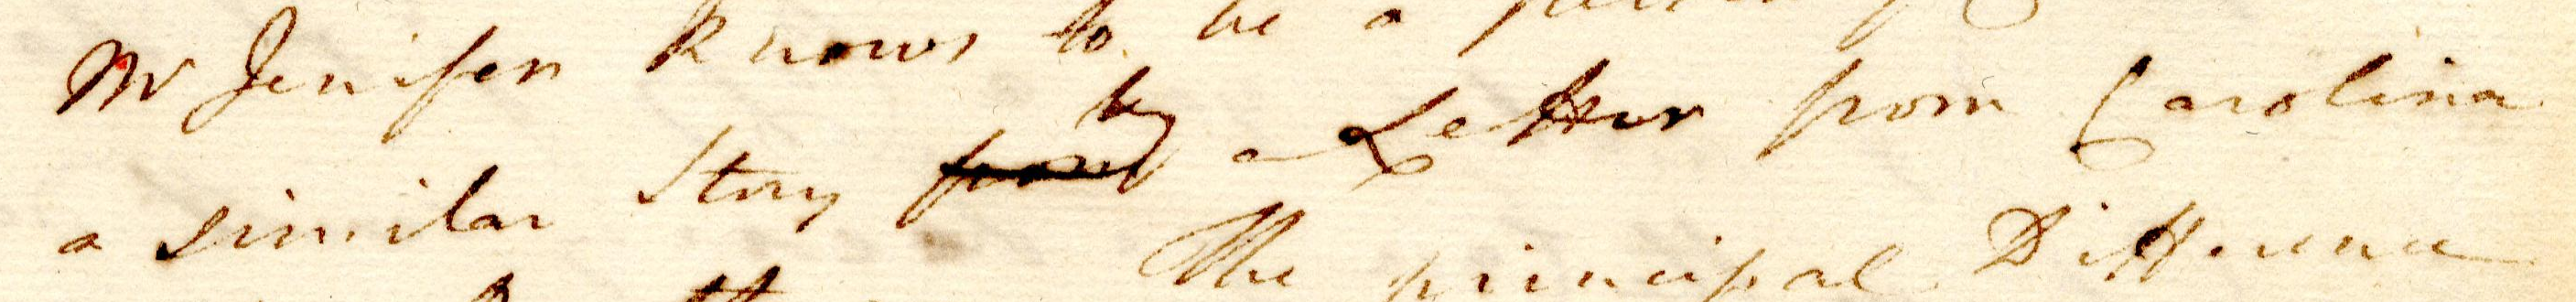a similar Story from ^ a Letter from Carolina
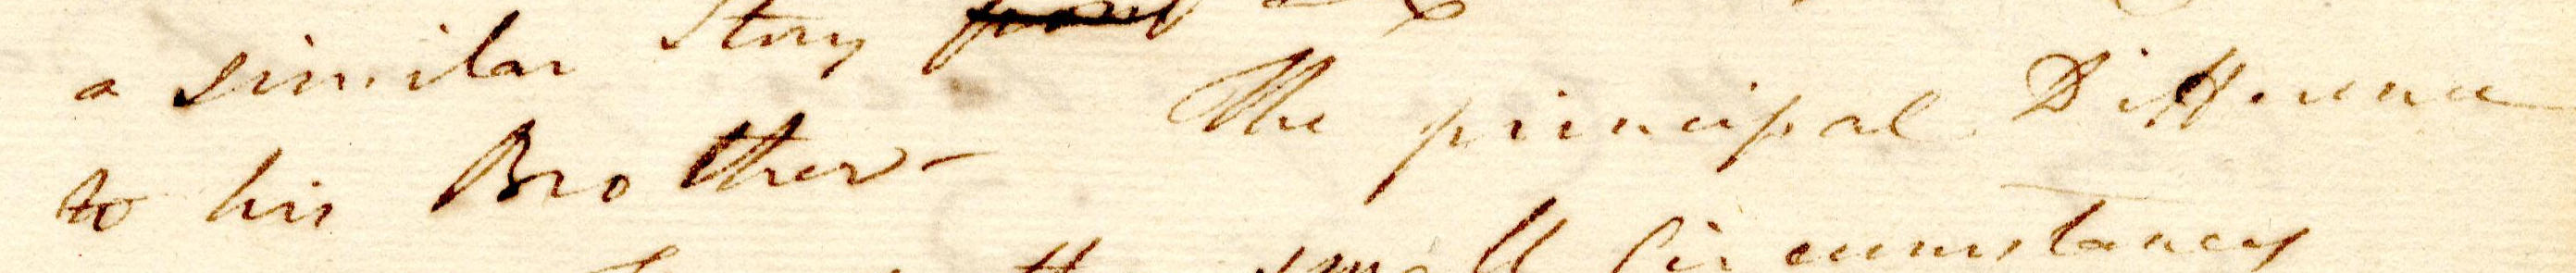to his Brother. The principal Difference
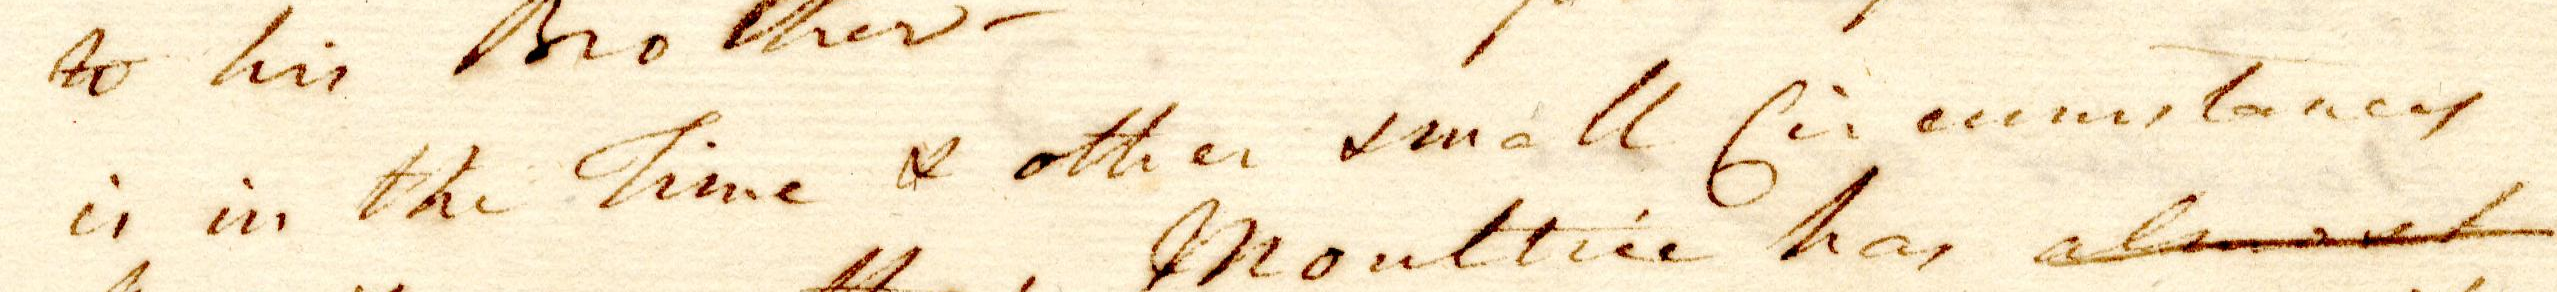is in the Time & other small Circumstances
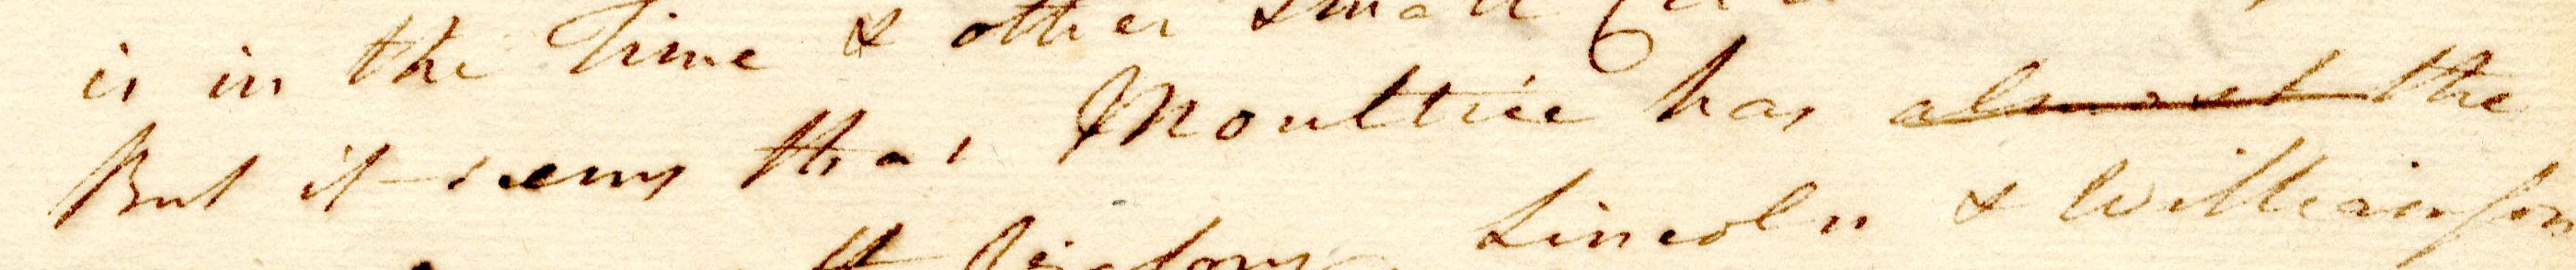But it seems that Moultice has almost the
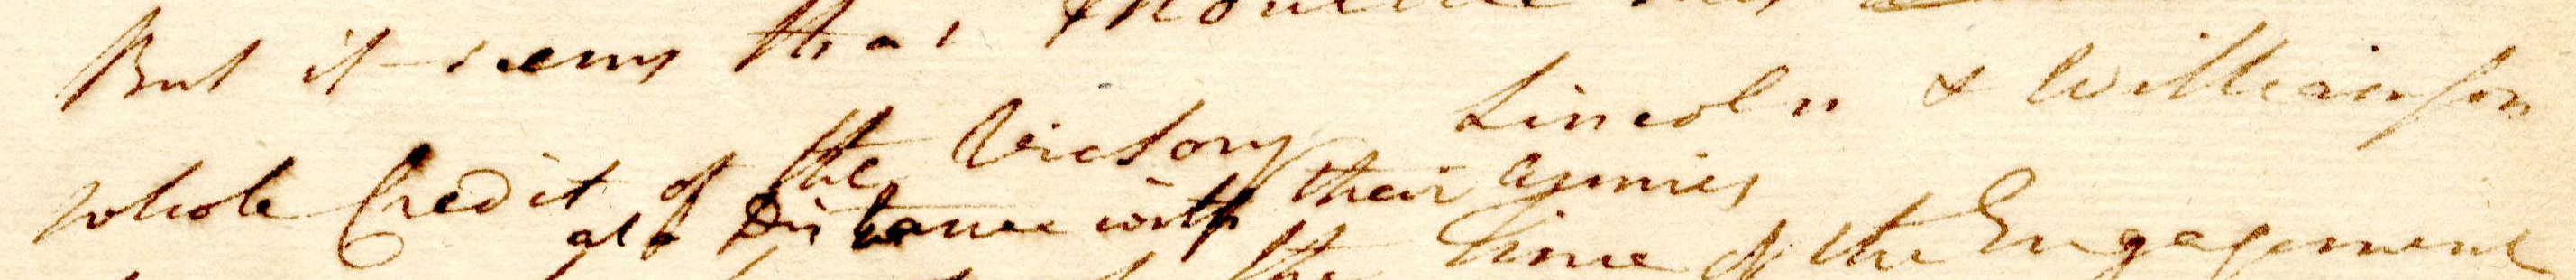whole Credit of the Victory, Lincoln & Williamson
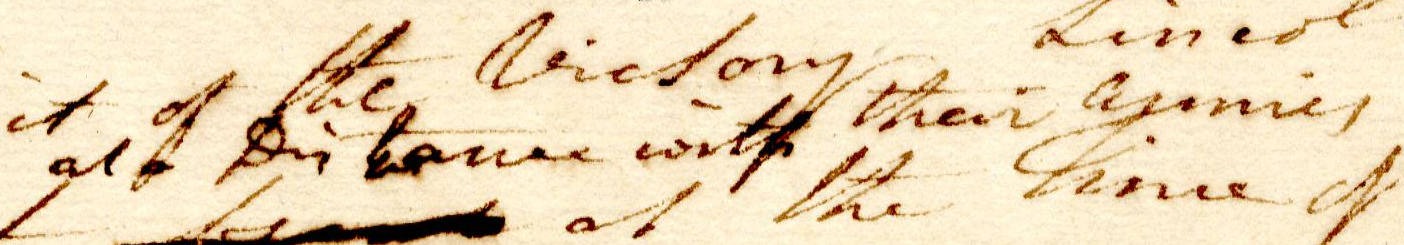at a Distance with their armies
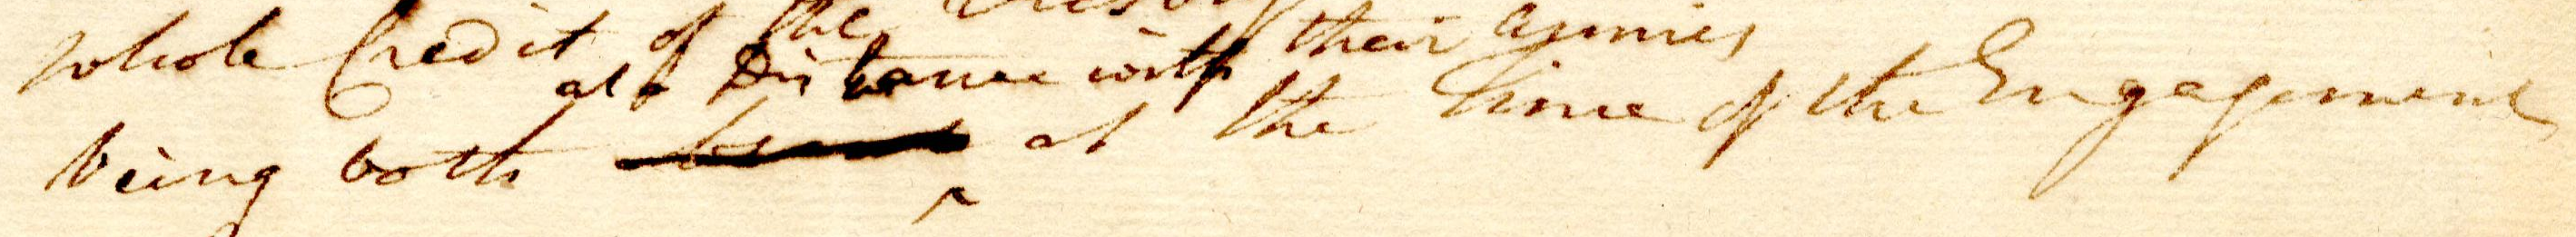being both observed ^ at the Time of the Engagement
